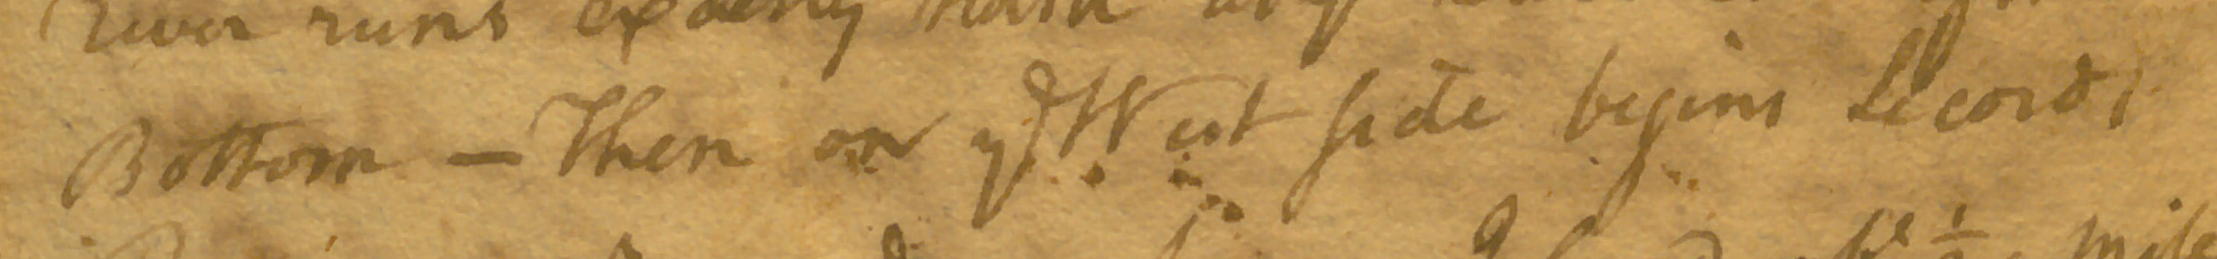Bottom- Then on y^e West side begins Secords
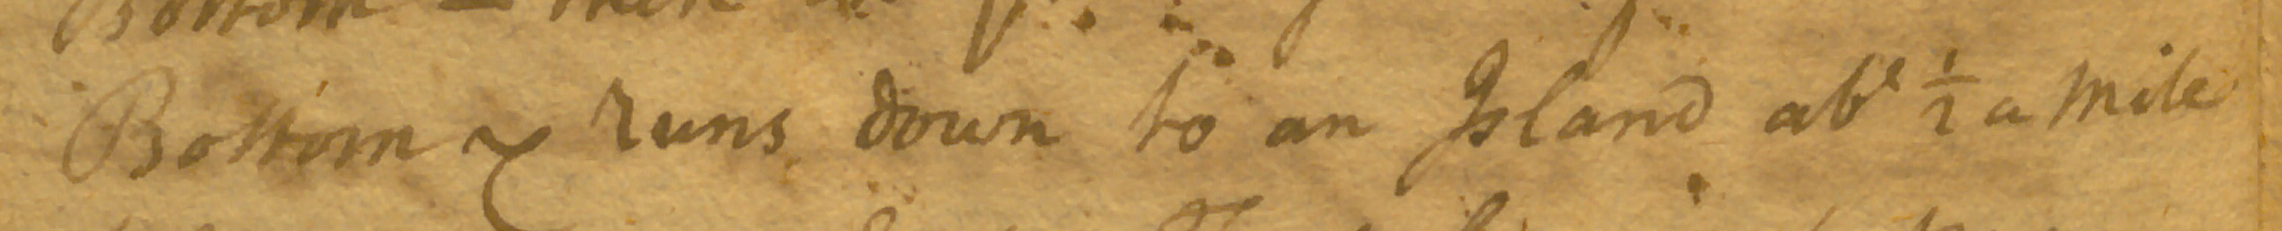Bottom & runs down to an Island ab^t 1/2 a mile
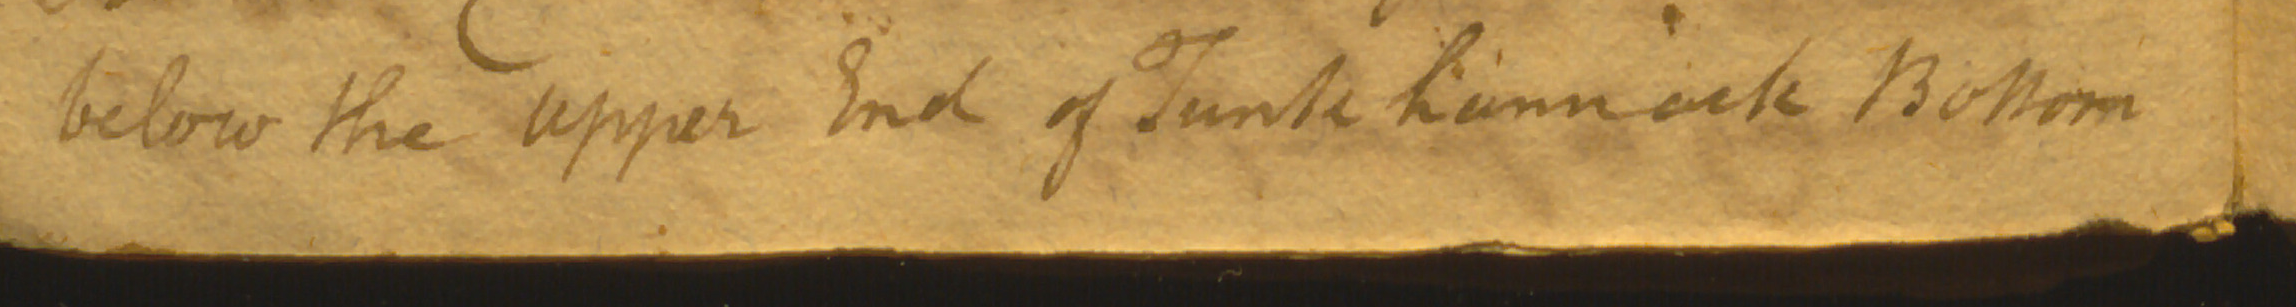below the upper End of Tunkhannock Bottom
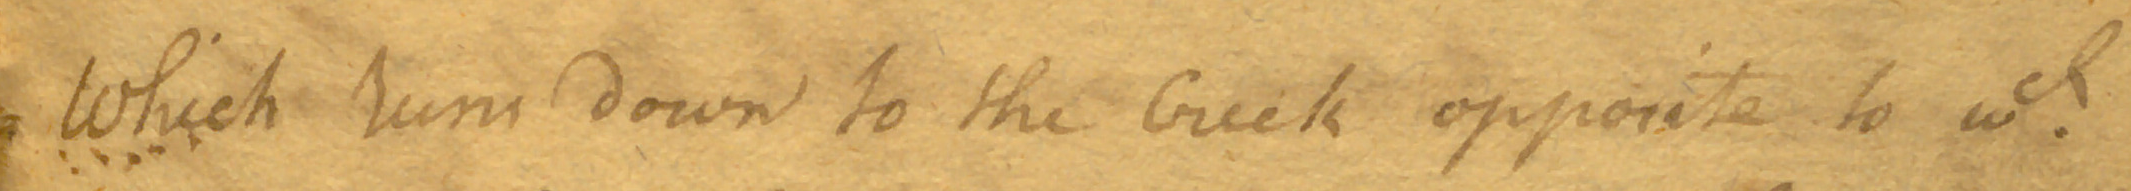which runs down to the Creek opposite to w^ch.
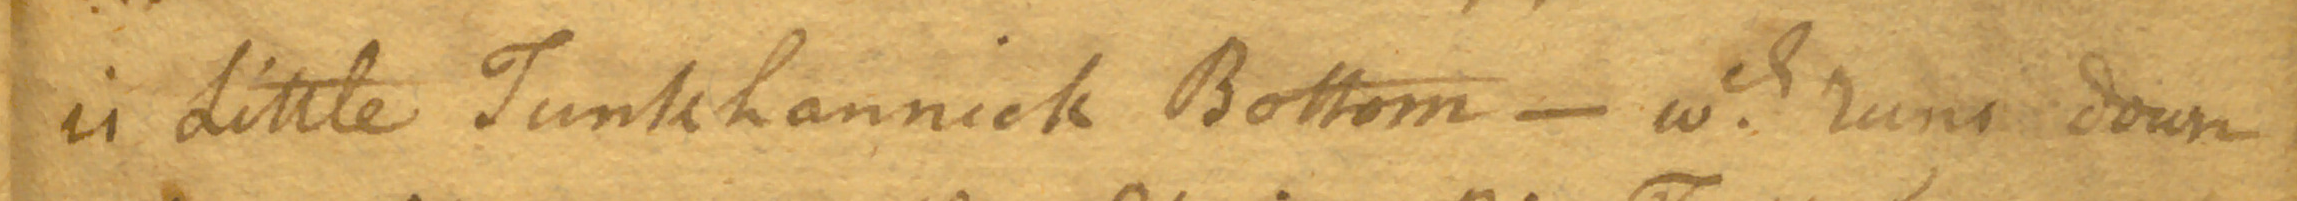is Little Tunkhannick Bottom- w^ch. runs down
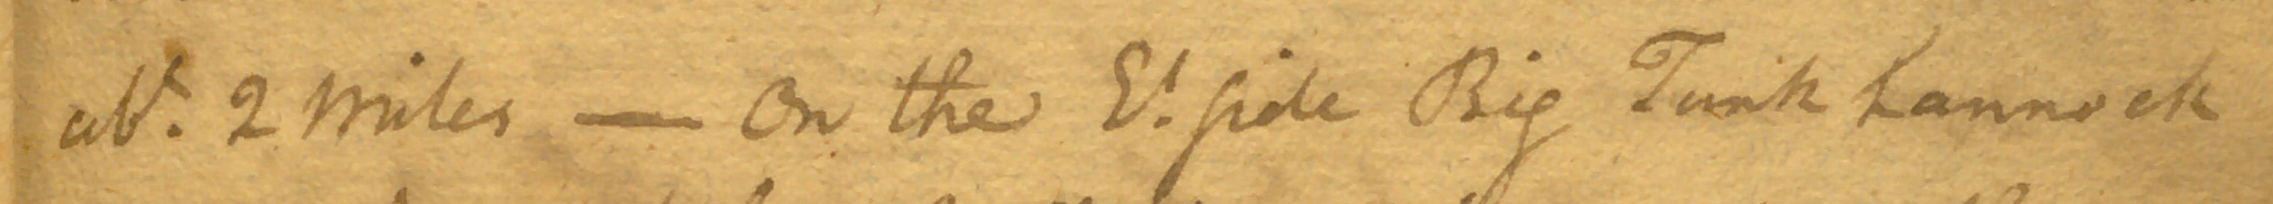ab^t 2 miles- on the E^t. side Big Tunkhannock
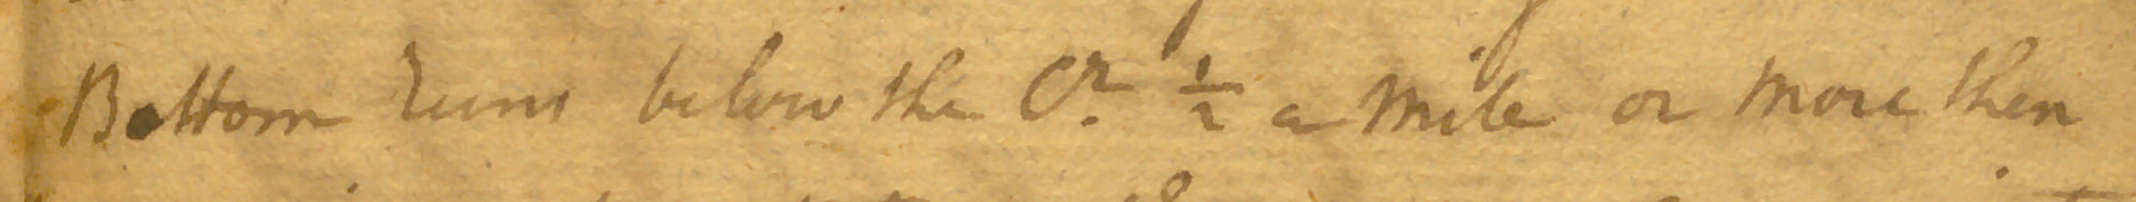Bottom runs below the C^r. 1/2 a mile or more then
